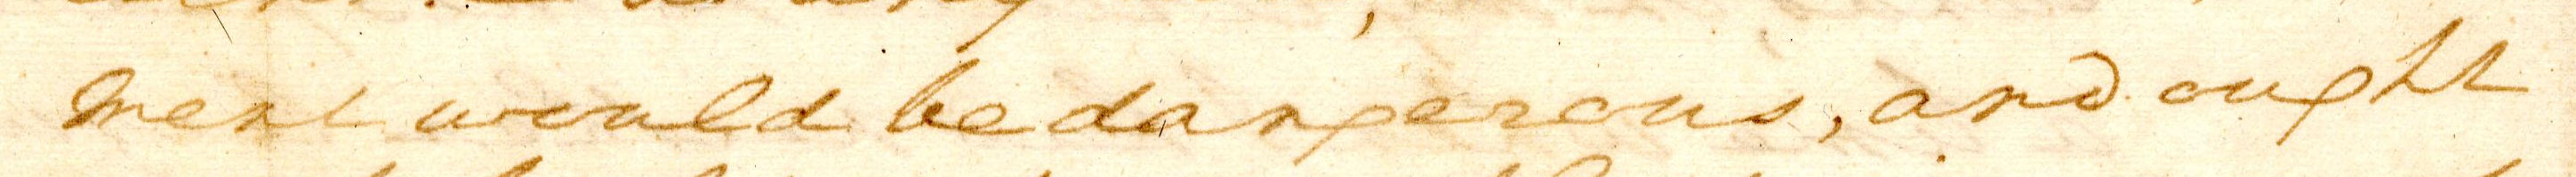ment would be dangerous, and ought
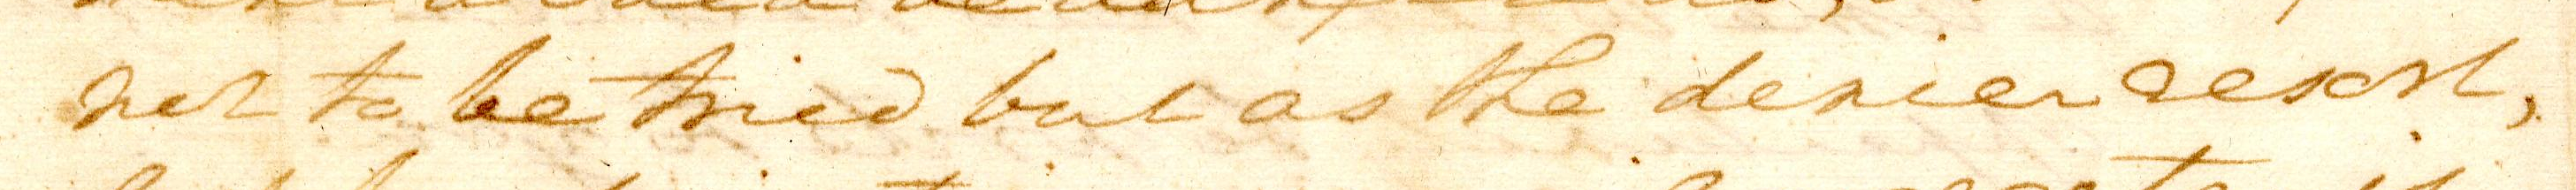not to be tried but as the denier resart,
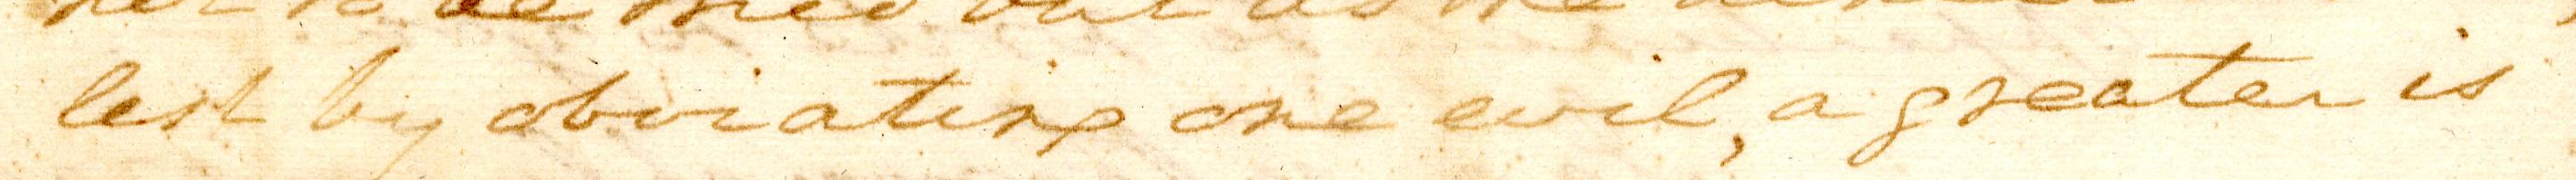lest by obviating one evil a greater is
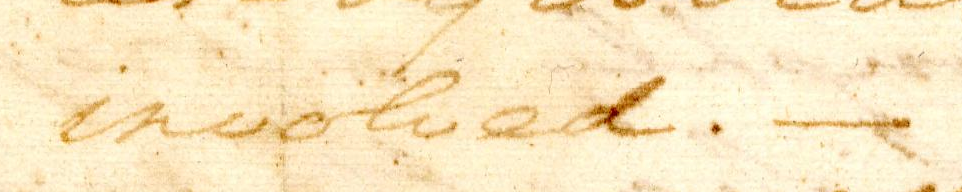involved.-
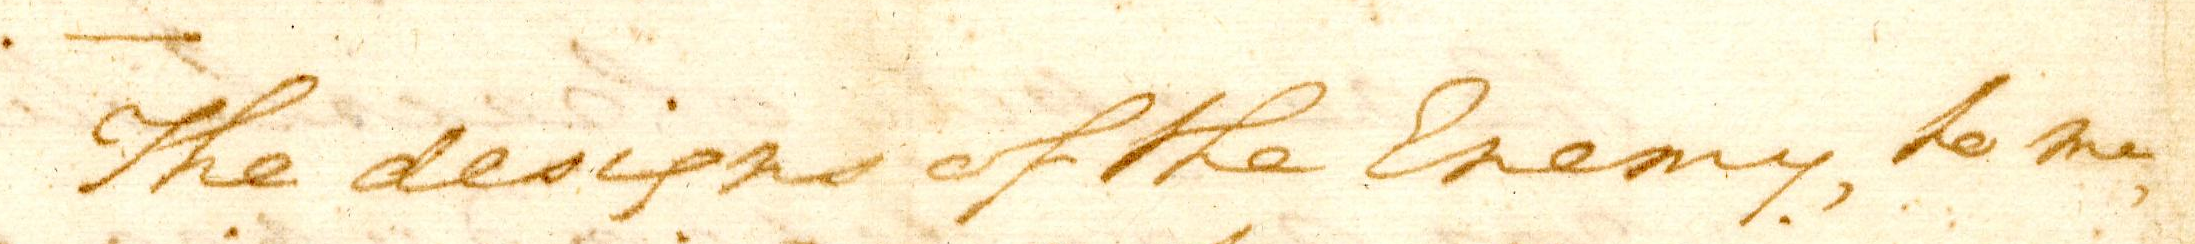The designs of the Enemy to me
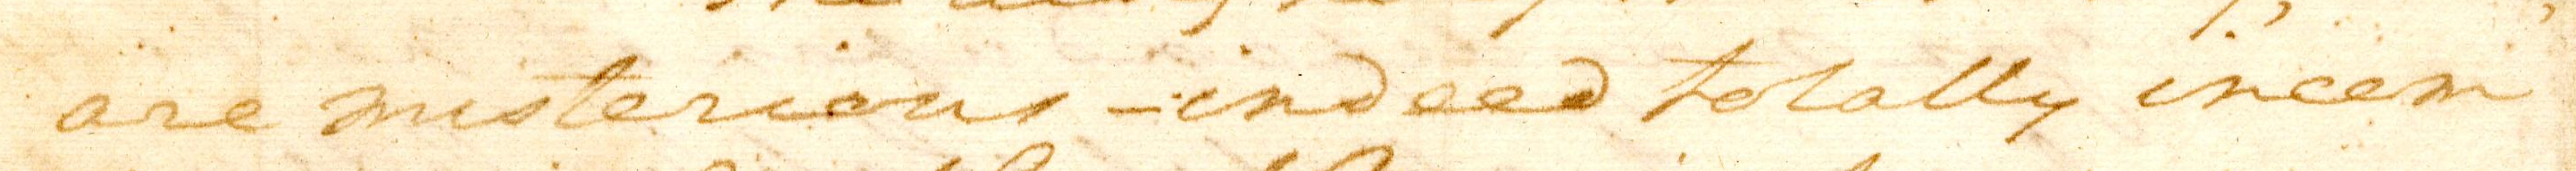are mysterious- indeed totally incom-
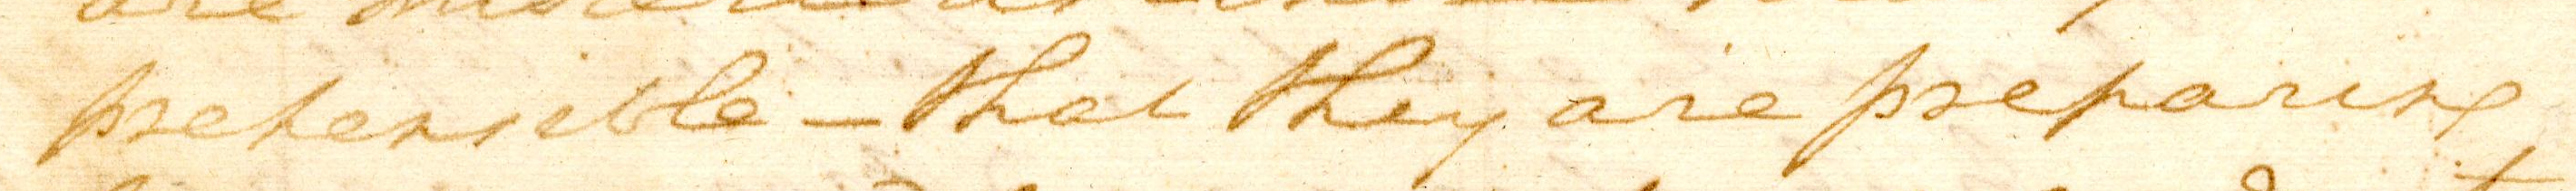prehensible- that they are preparing
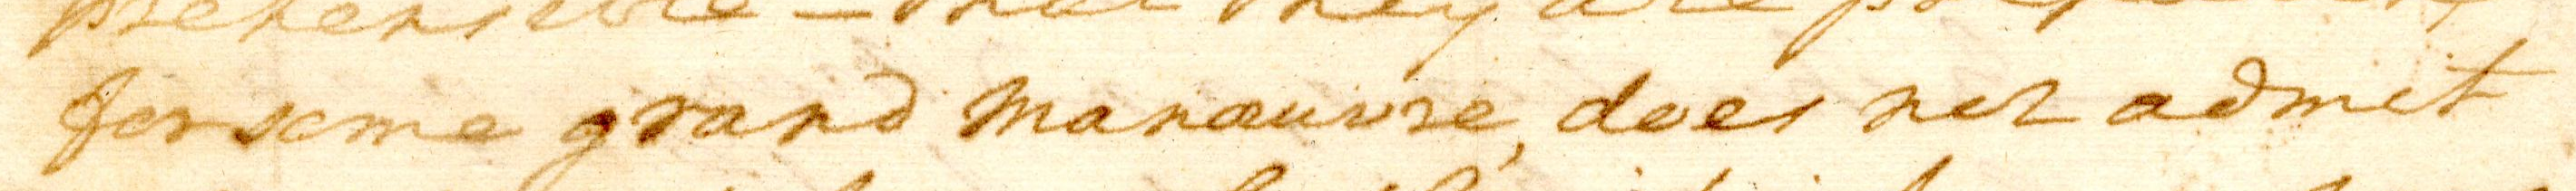for some grand manoeuvre, does not admit
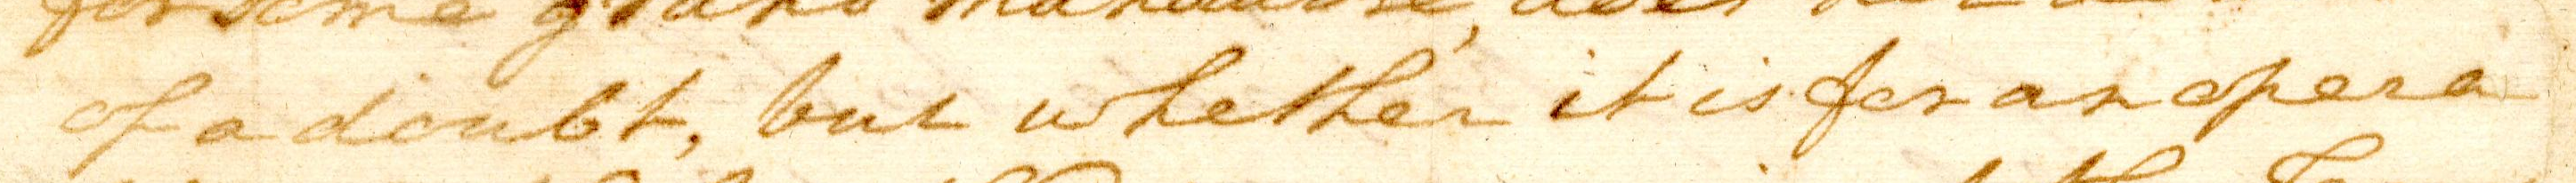of a doubt, but whether it is for an opera-
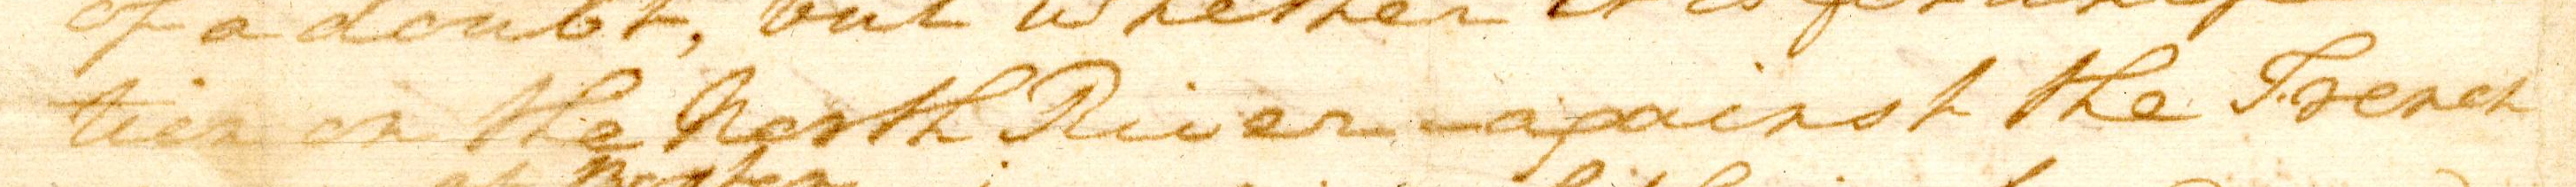-tior on the North River against the French
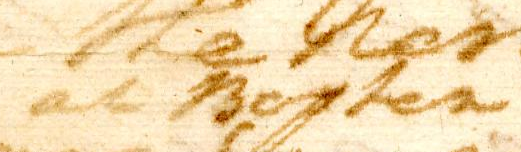at Boston
